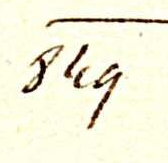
849
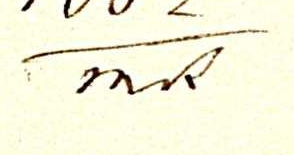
MR
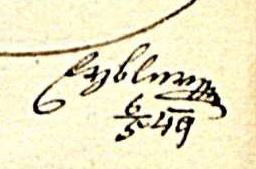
Eyblerxx
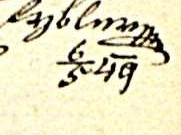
6 5 49
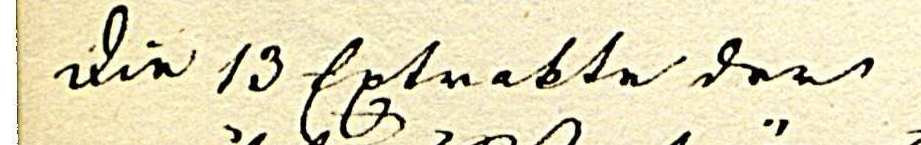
Die 13 Extrakte der
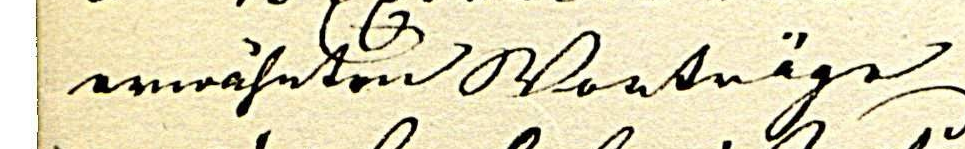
erwähnten Vorträge
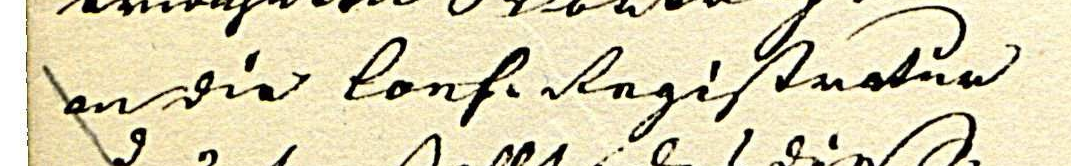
an die Conf. Registratur
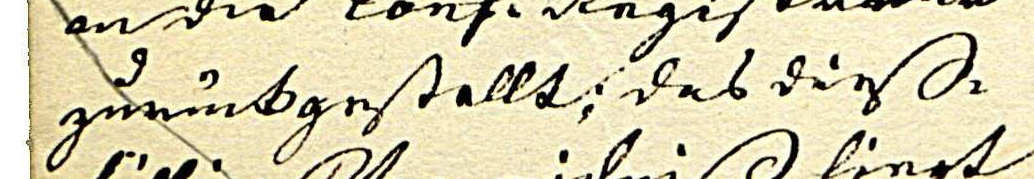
zurück gestellt; des dieß¬
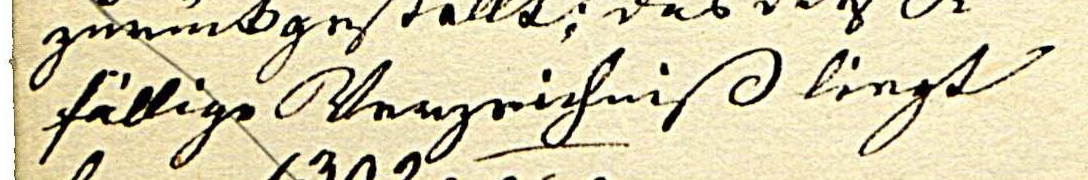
fällige Verzeichniß liegt
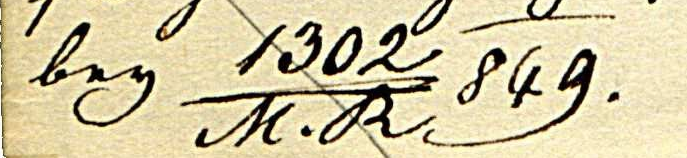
bey 1302/ 849
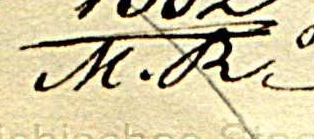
M. R.
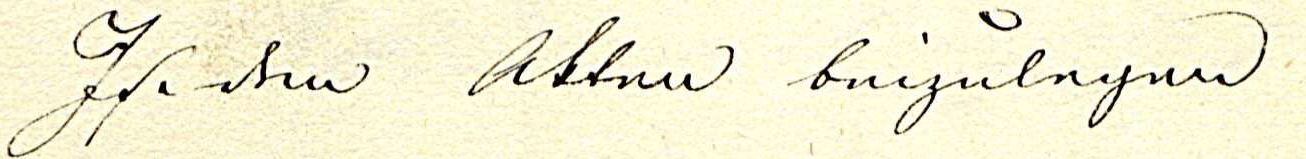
Jst den Akten beizulegen
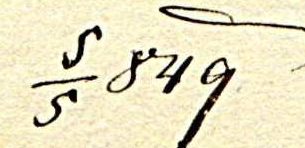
5/5 849
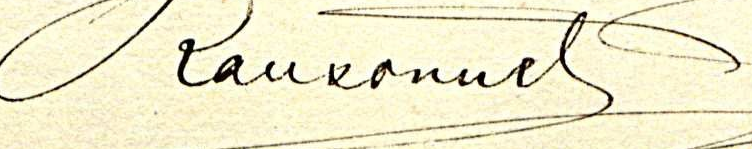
Rauxx
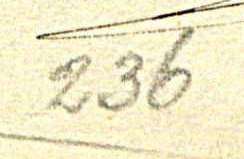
236
